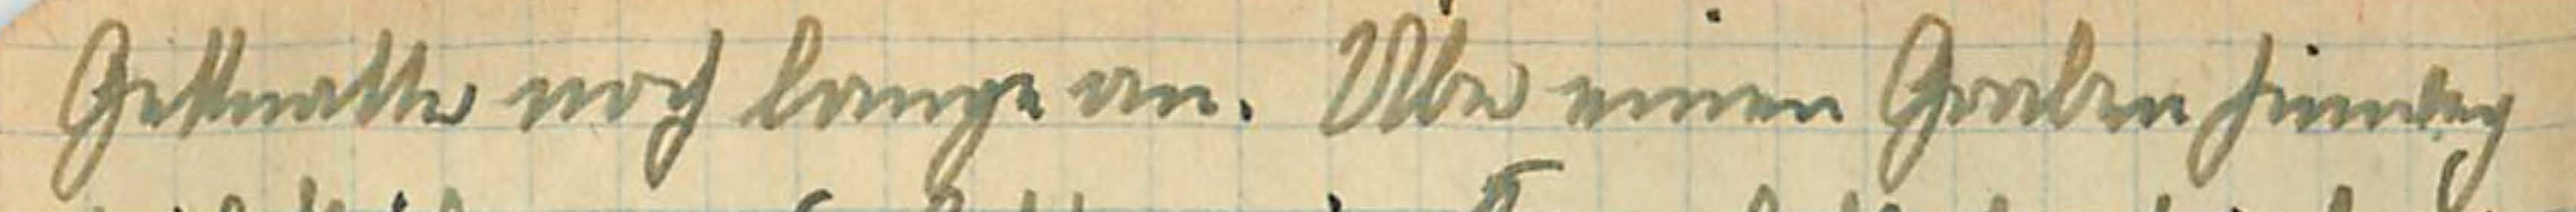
Geknatter noch lange an. Über einen Graben hinweg
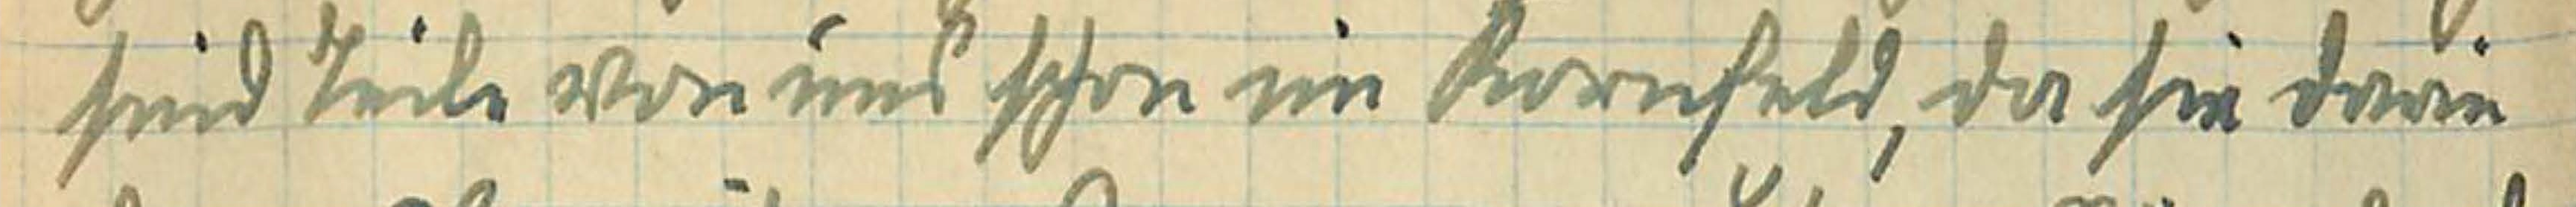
sind Teile von uns schon im Kornfeld, da sie darin
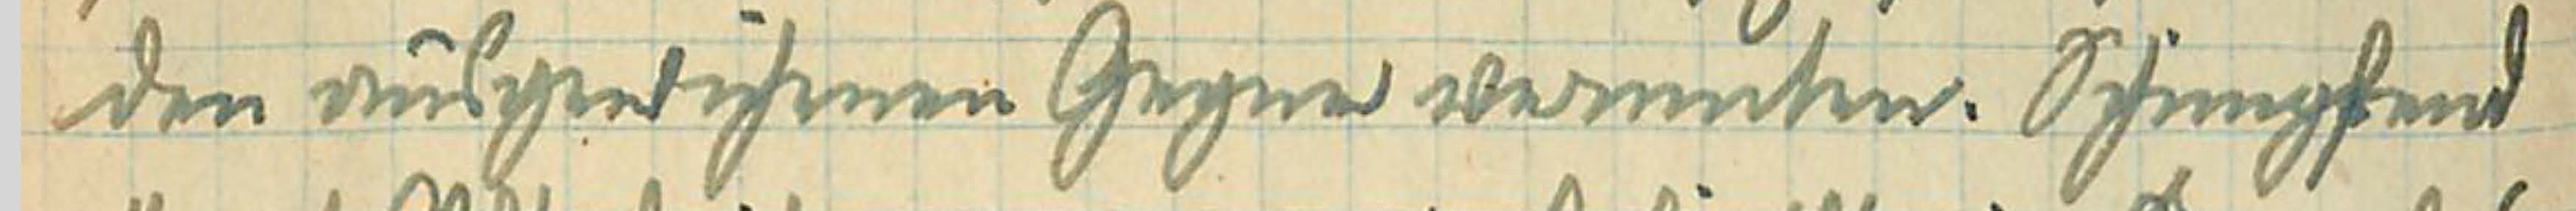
den ausgewichenen Gegner vermuten. Schimpfend
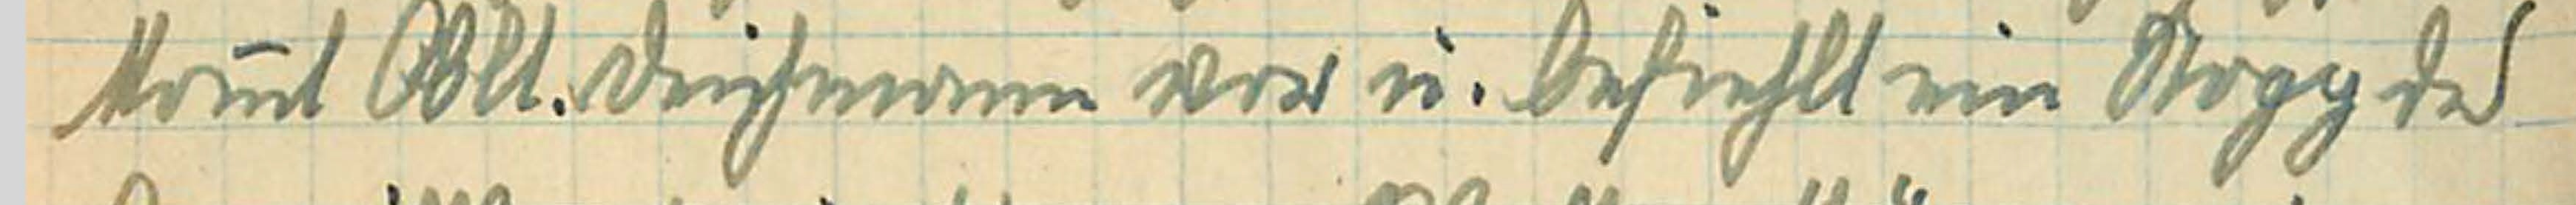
kommt Oblt. Deichmann vor u. befiehlt ein Stopp des
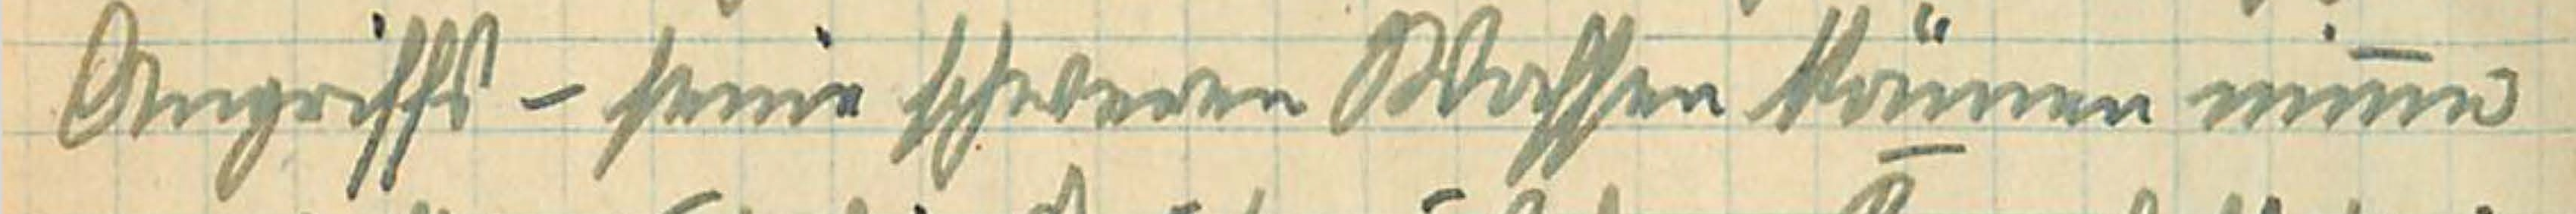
Angriffs – seine schweren Waffen kämen nimmer
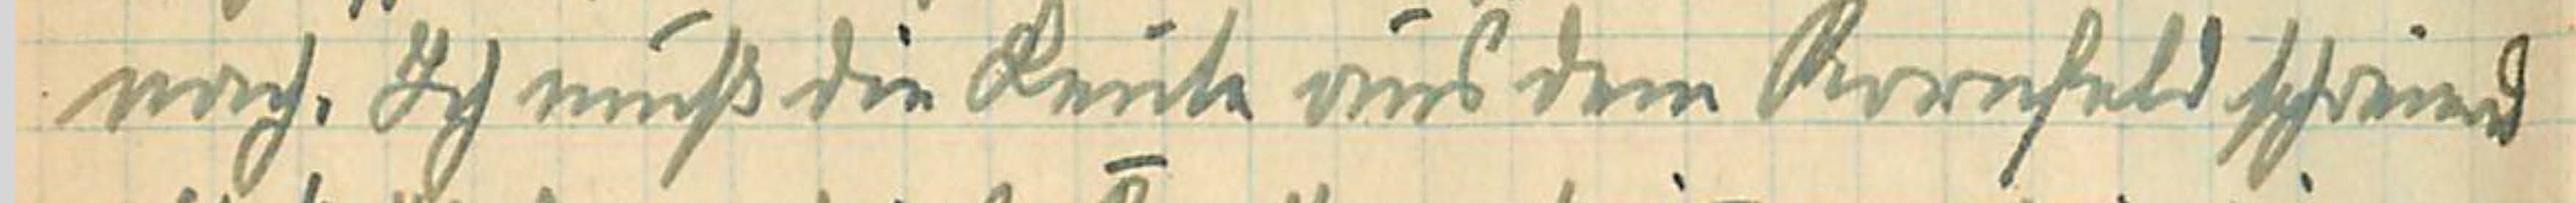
nach. Ich muß die Leute aus dem Kornfeld schreiend
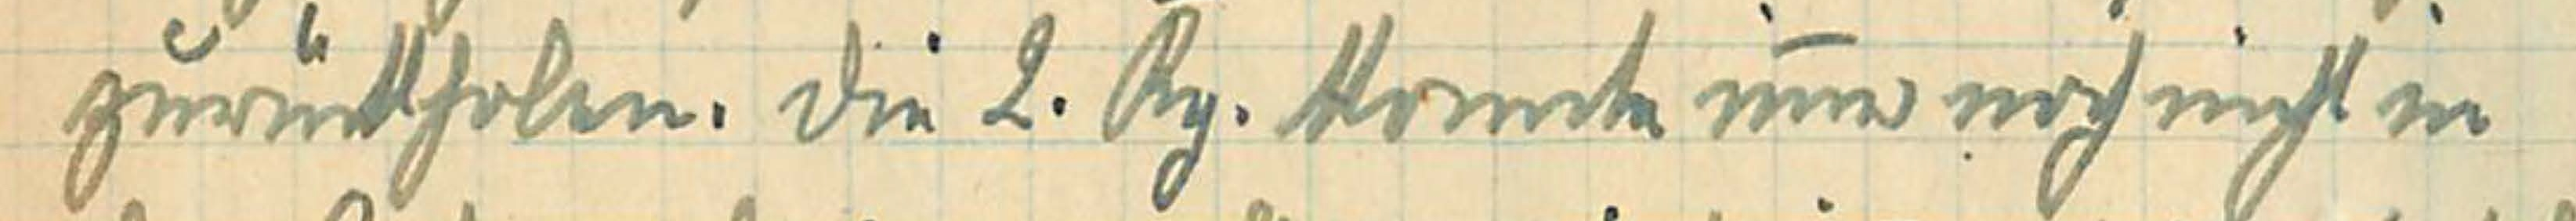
zurückholen. Die 2. Kp. konnte immer noch nicht in
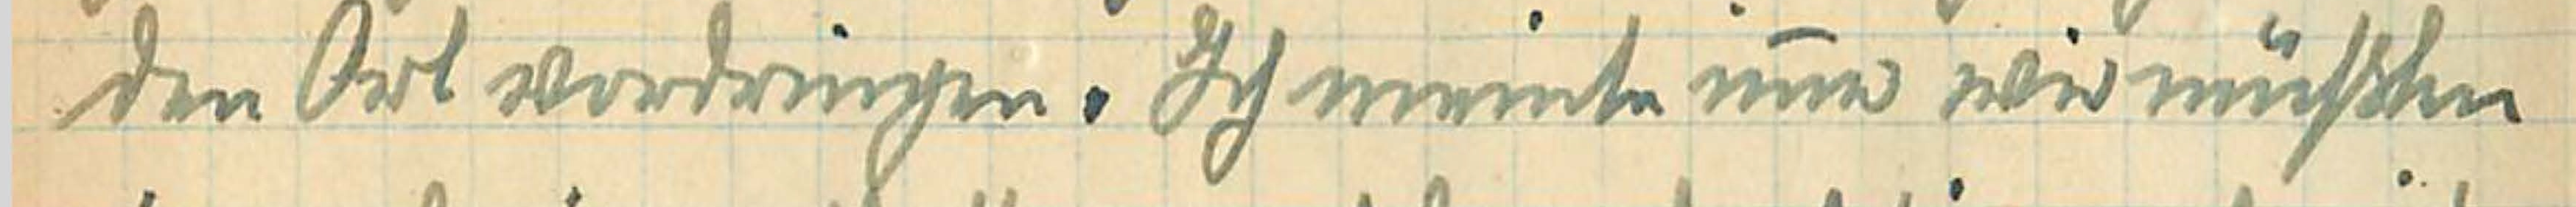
den Ort vordringen. Ich meinte immer wir müßten
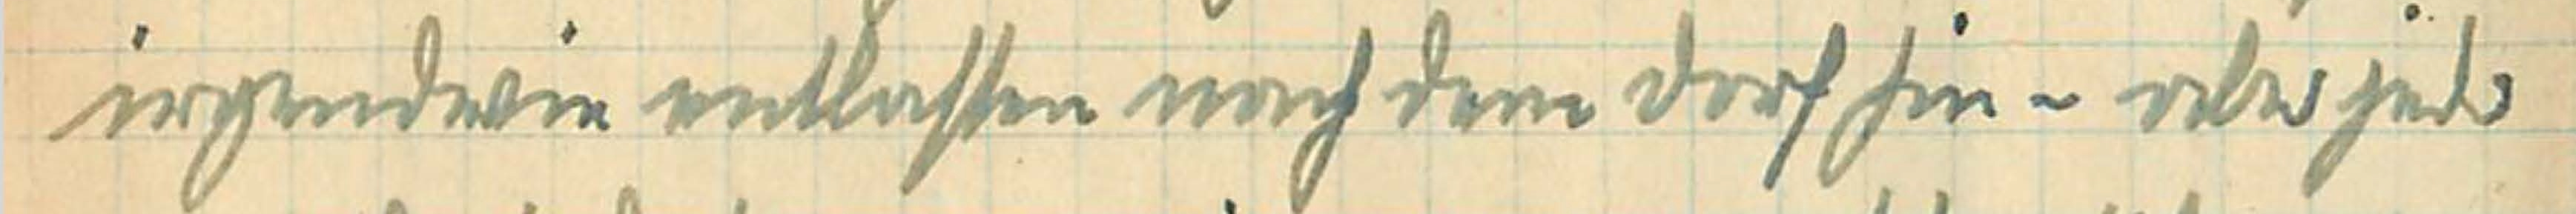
irgendwie entlasten nach dem Dorf hin – aber jeder
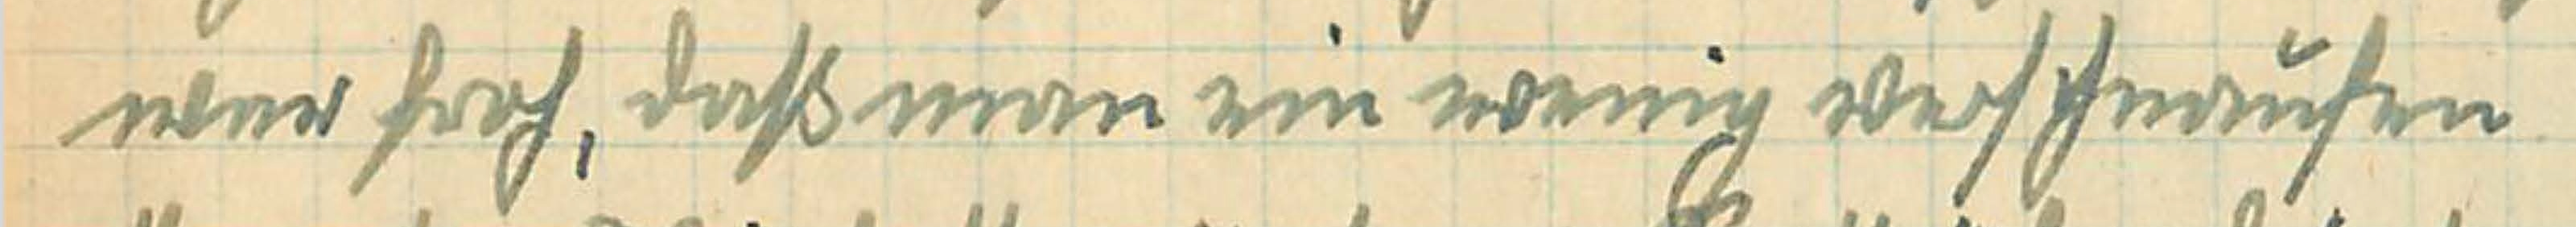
war froh, daß man ein wenig verschnaufen
